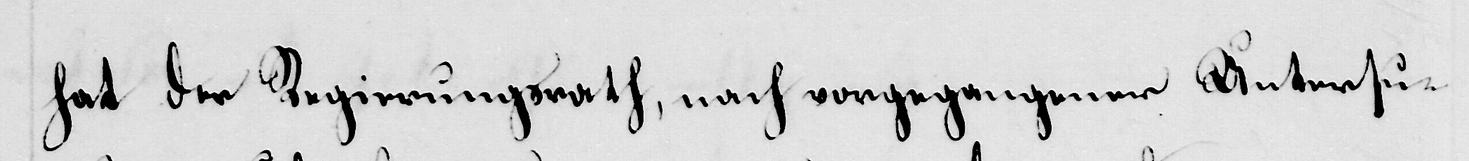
hat der Regierungsrath, nach vorgegangener Untersu¬
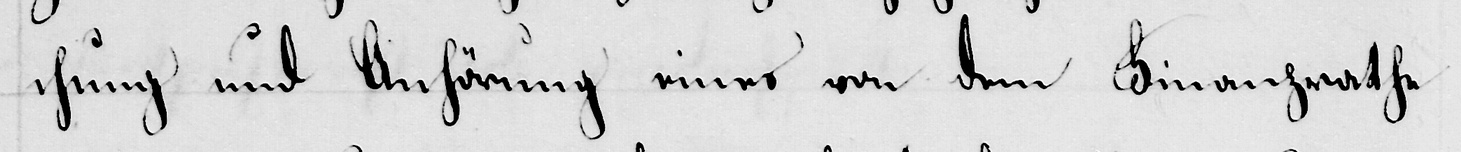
chung und Anhörung eines von dem Finanzrathe
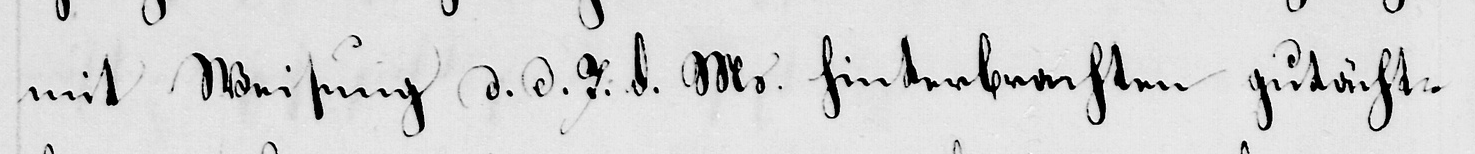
mit Weisung d. d. 7. d. Ms. hinterbrachten gutächt¬
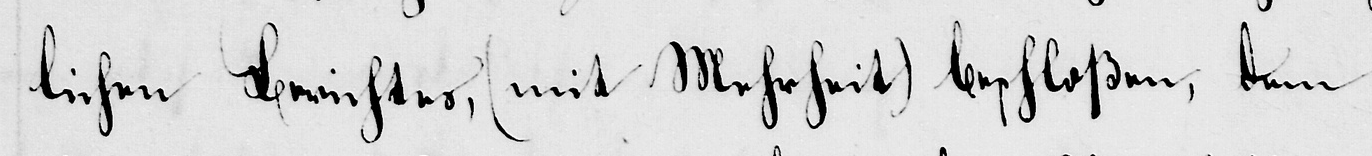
lichen Berichtes, (mit Mehrheit) beschloßen, dem
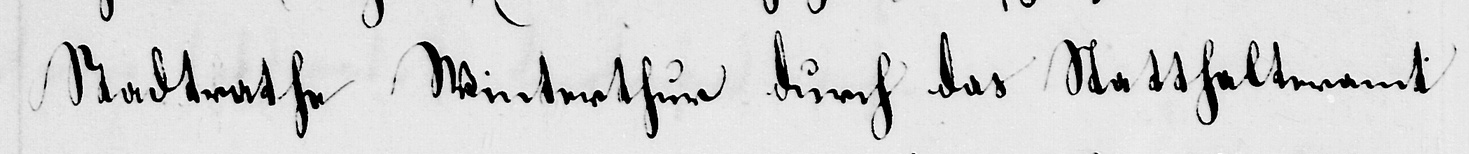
Stadtrathe Winterthur durch das Statthalteramt
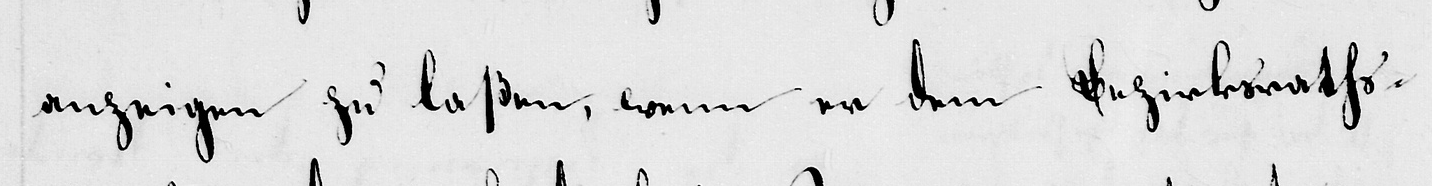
anzeigen zu laßen, wenn er dem Bezirksraths¬
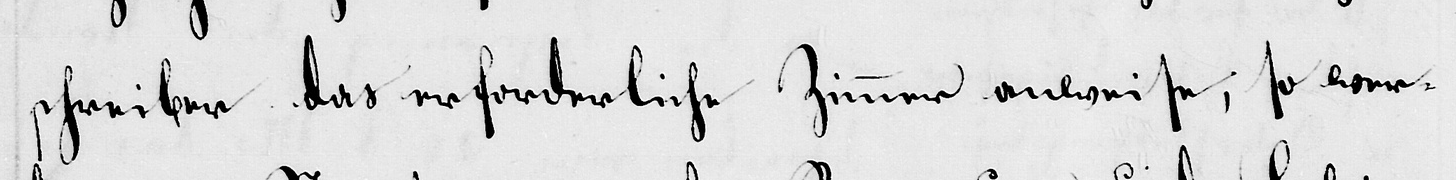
schreiber das erforderliche Zimmer anweise, so wer¬
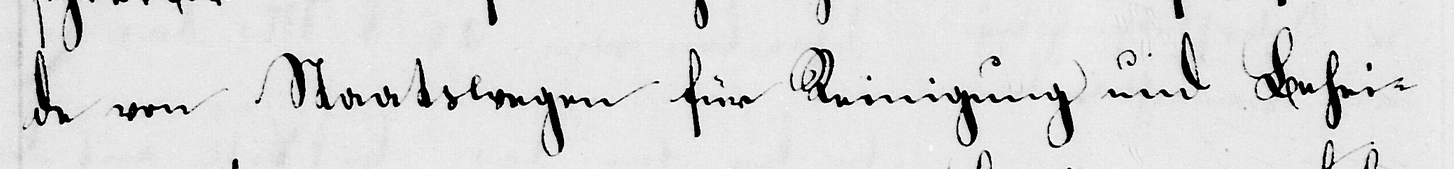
de von Staatswegen für Reinigung und Behei¬
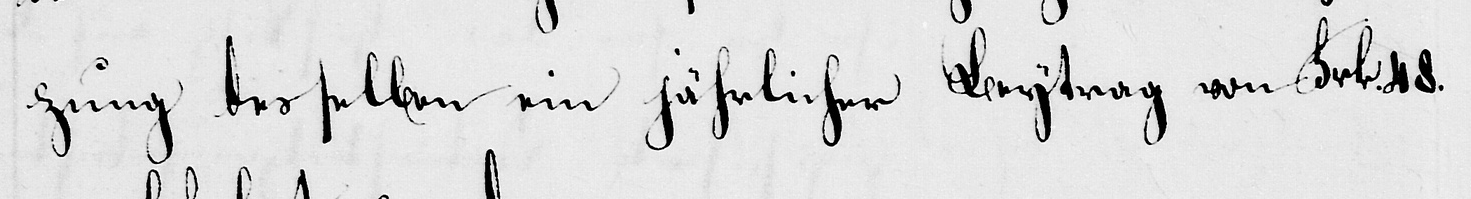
zung desselben ein jährlicher Beytrag von Frk. 48.
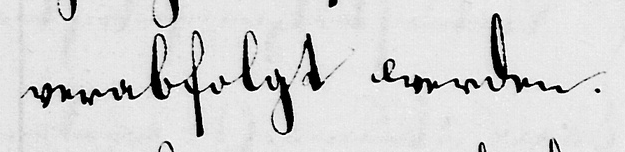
verabfolgt werden.
